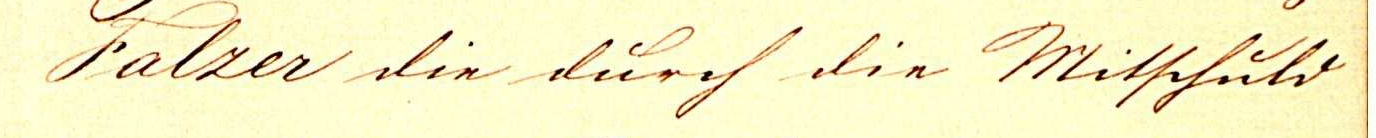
Falzer die durch die Mitschuld
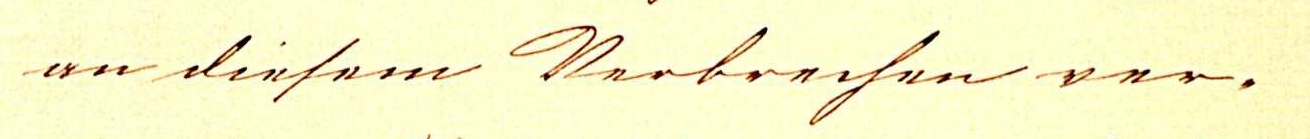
an diesem Verbrechen ver¬
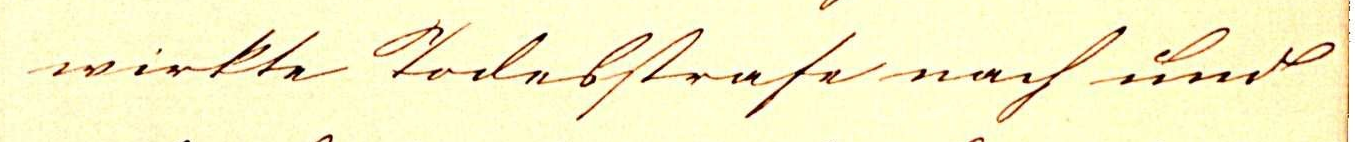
wirkte Todesstrafe nach und
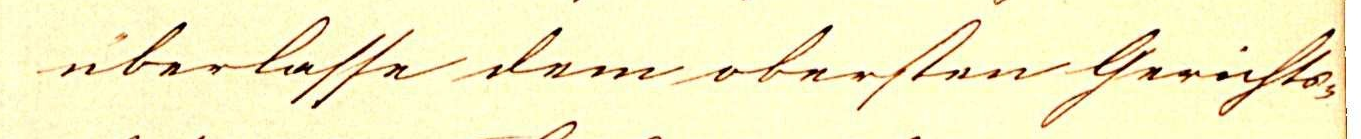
überlasse dem obersten Gerichts¬
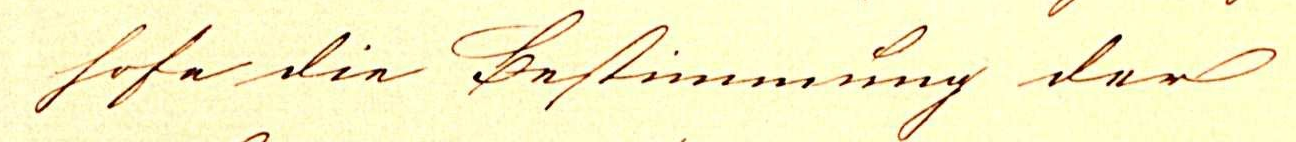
hofe die Bestimmung der
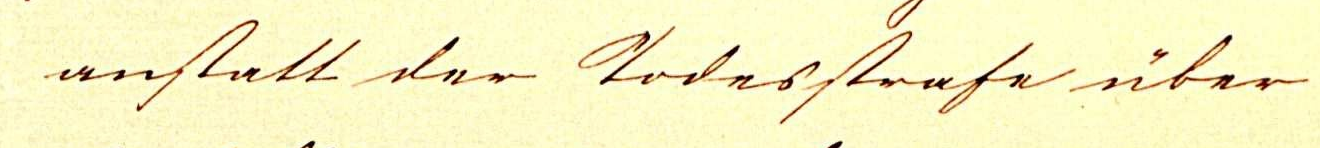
anstatt der Todesstrafe über
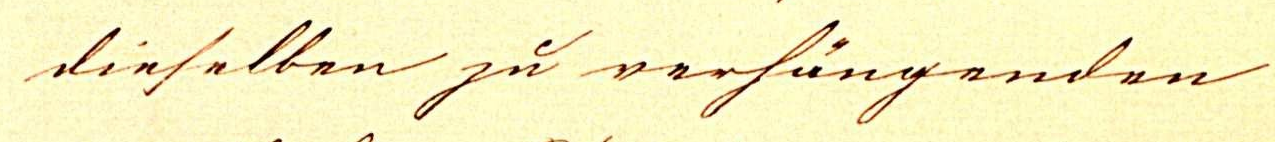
dieselben zu verhängenden
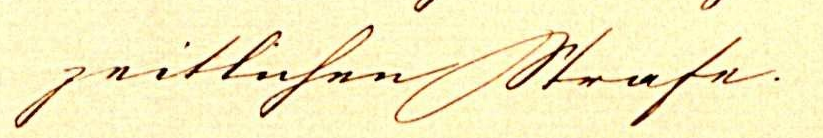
zeitlichen Strafe.
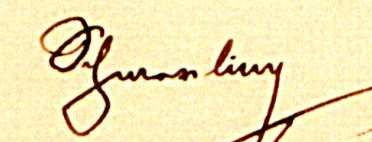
Schmerling
